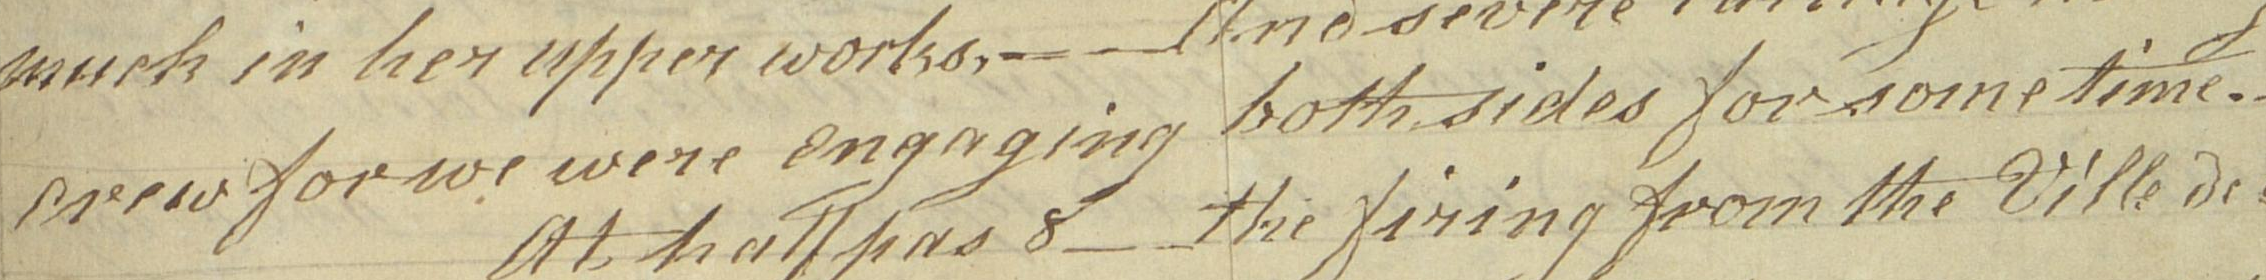crew for we were engaging both sides for some time.
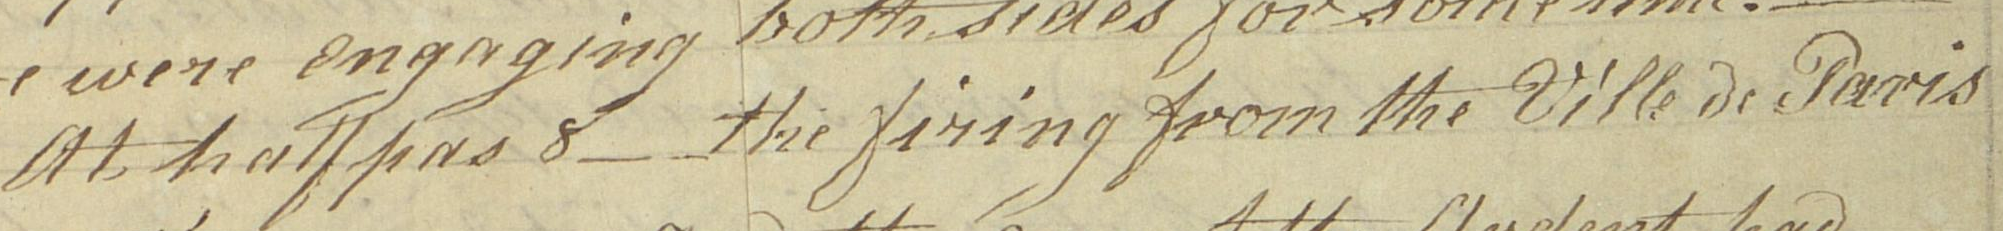At half pas 8 the firing from the Ville de Paris
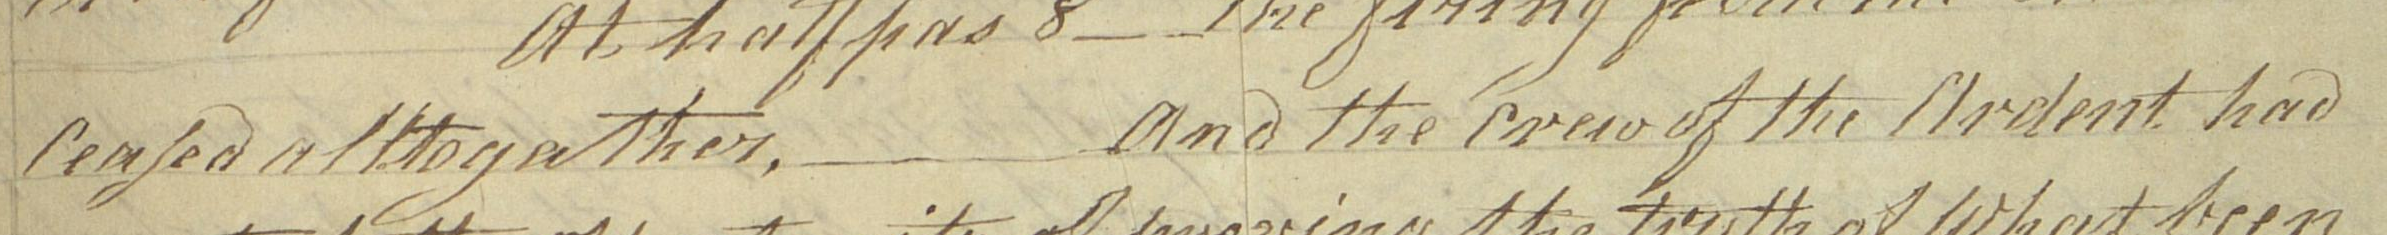ceasd altogather, and the Crew of the Ardent had
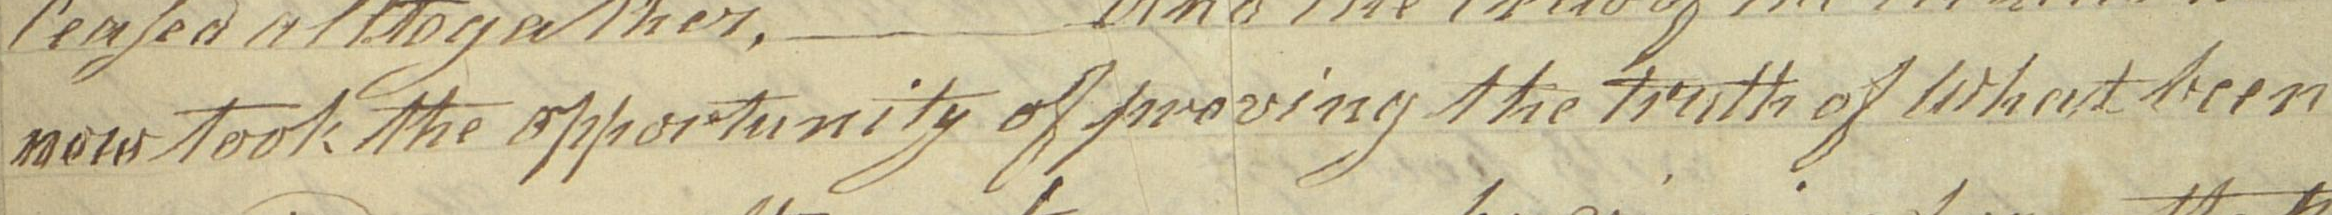now took the opportunity of proving the truth of what been
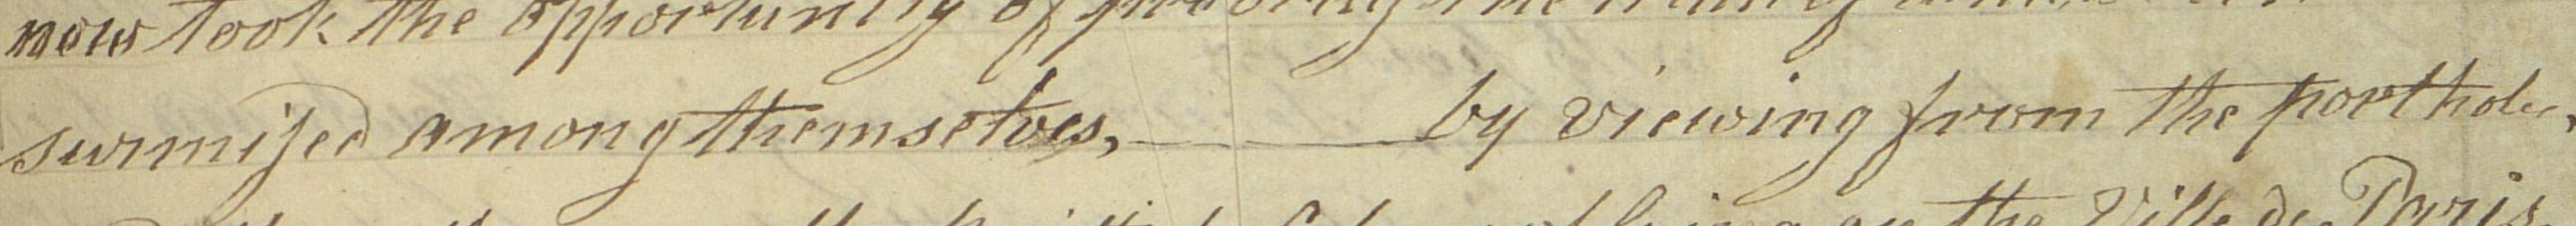surmised among themselves, by viewing from the porthole,
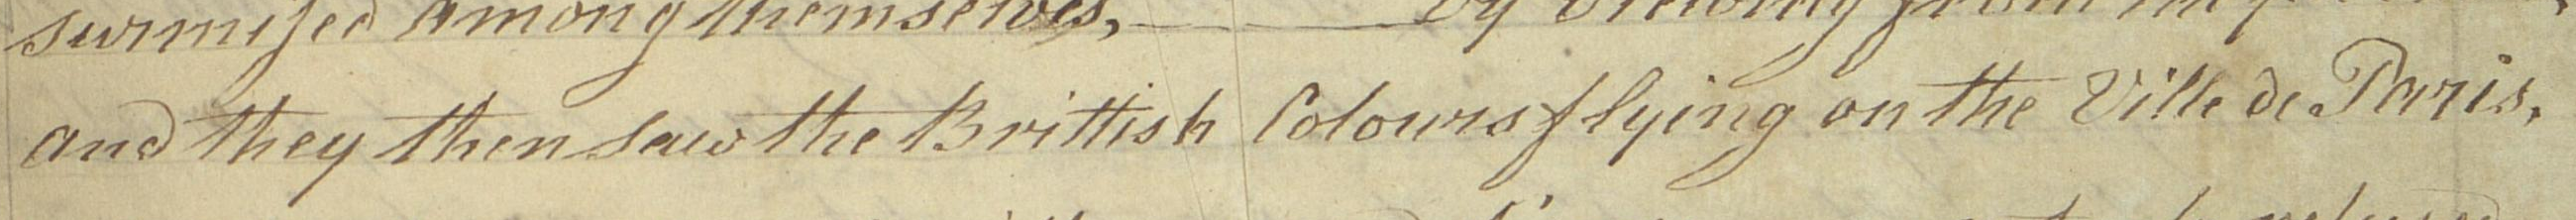and they then saw the Brittish Colours flying on the Ville de Paris,
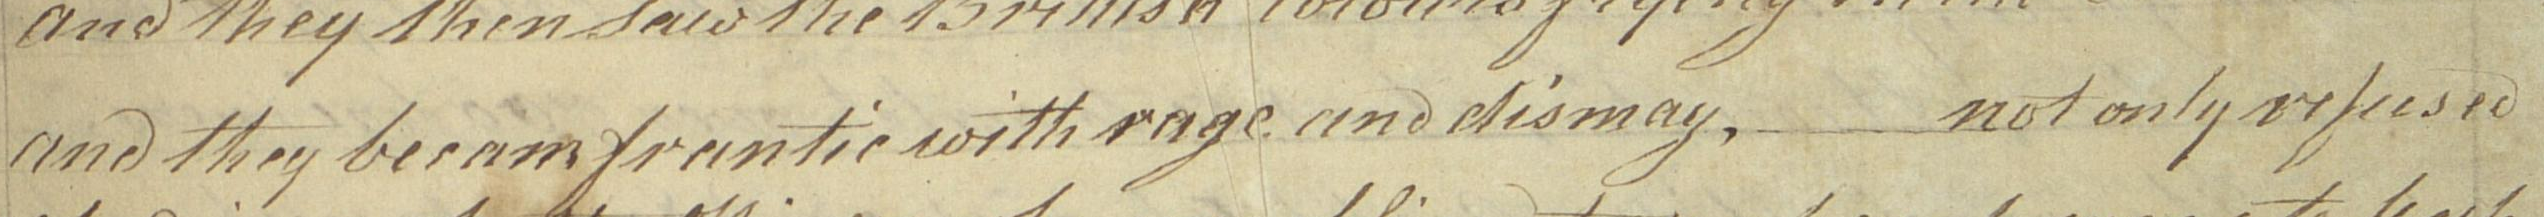and they becam frantic with rage and dismay, not only refused
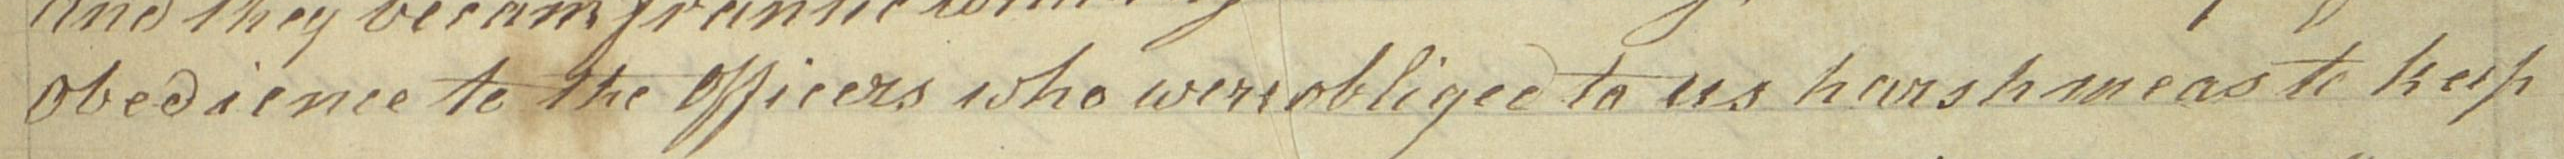obedience to the Officers who were obliged to us harsh meas to keep
